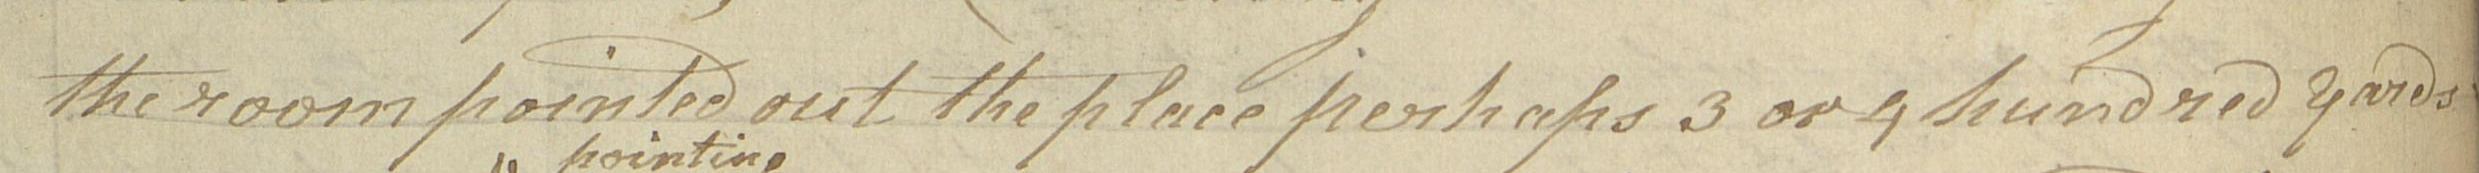the room pointed out the place perhaps 3 or 4 hundred yards
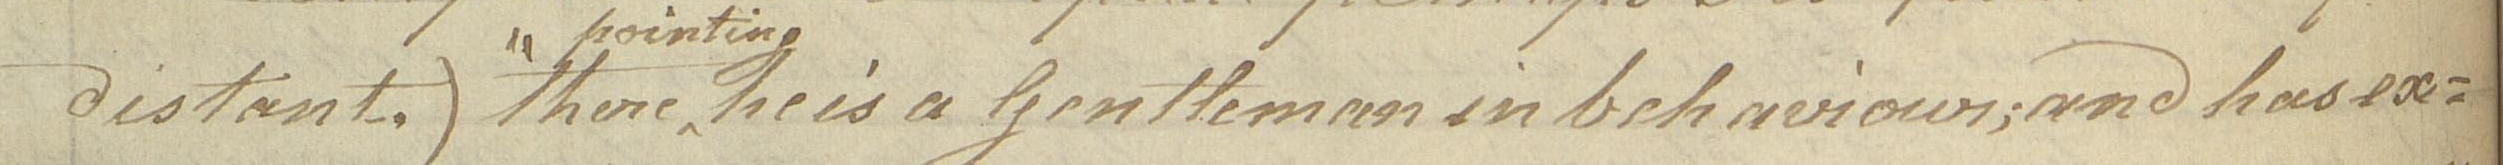distant.) "There ^ he is a Gentleman in behaviour; and has ex-
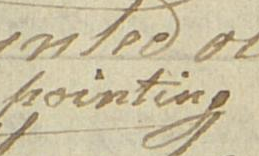pointing
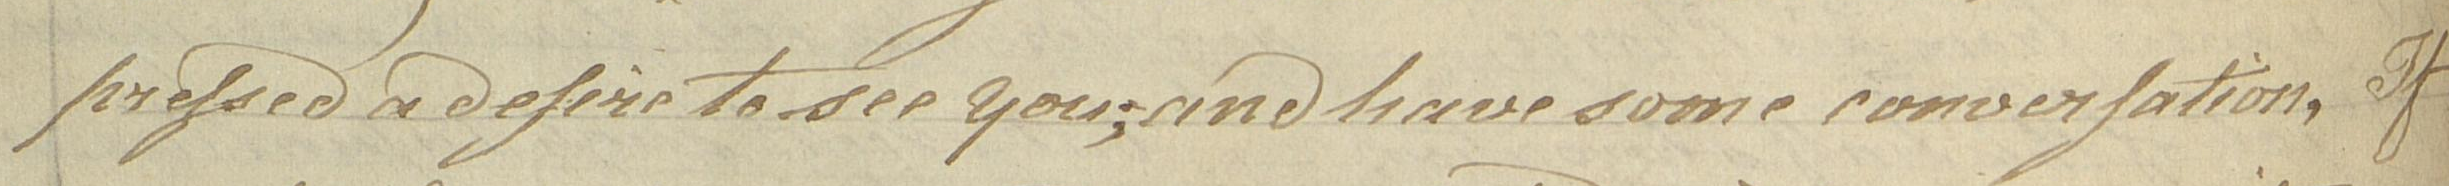pressed a desire to see you; and have some conversation, If
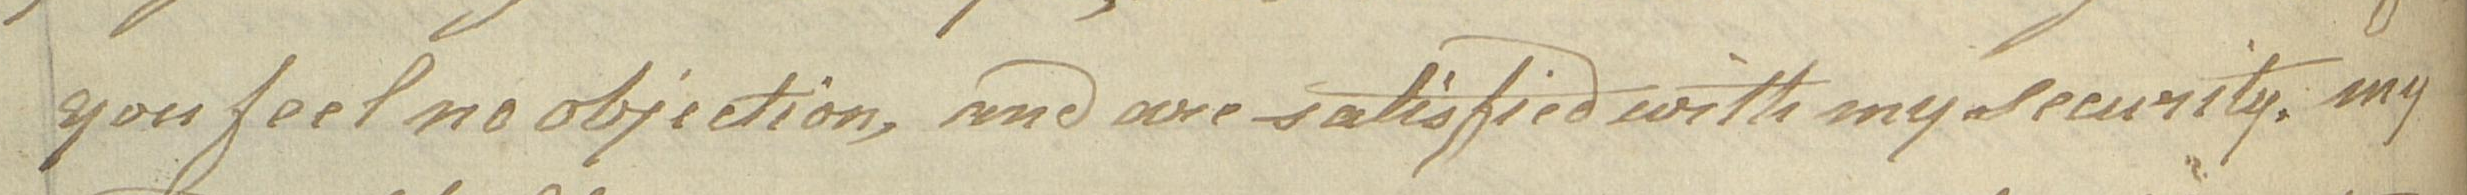you feel no objection, and are satisfied with my security. my
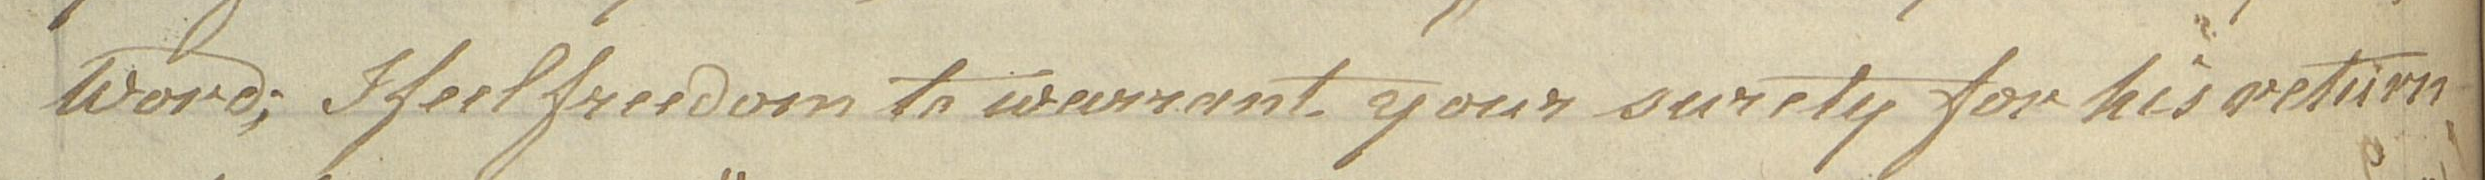Word; I feel freedom to warrant your surety for his return
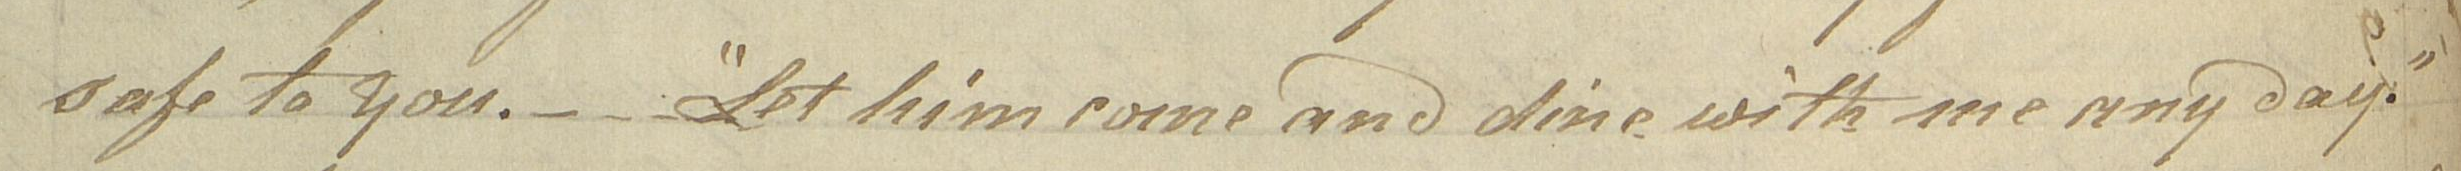safe to you. "Let him come and dine with me my day."
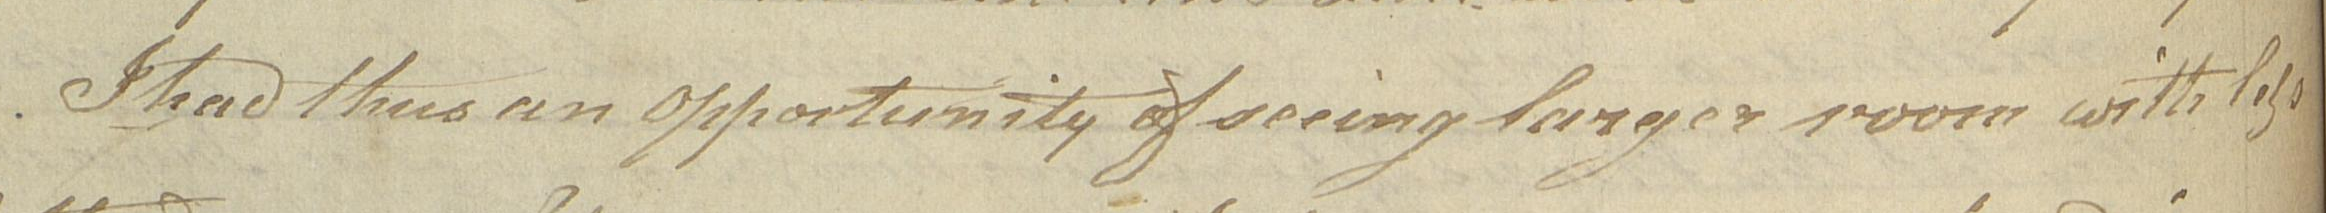I had thus an opportunity of seeing larger room with less
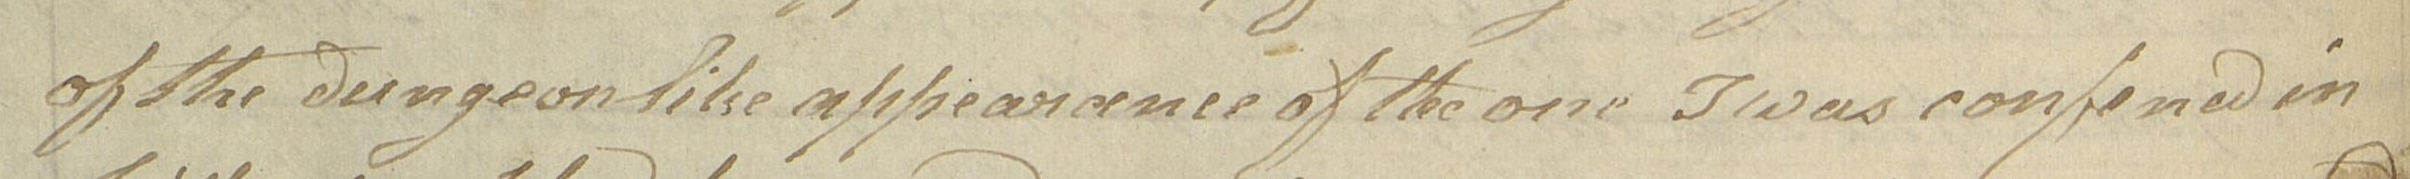of the dungeon like appearance of the one I was confined in
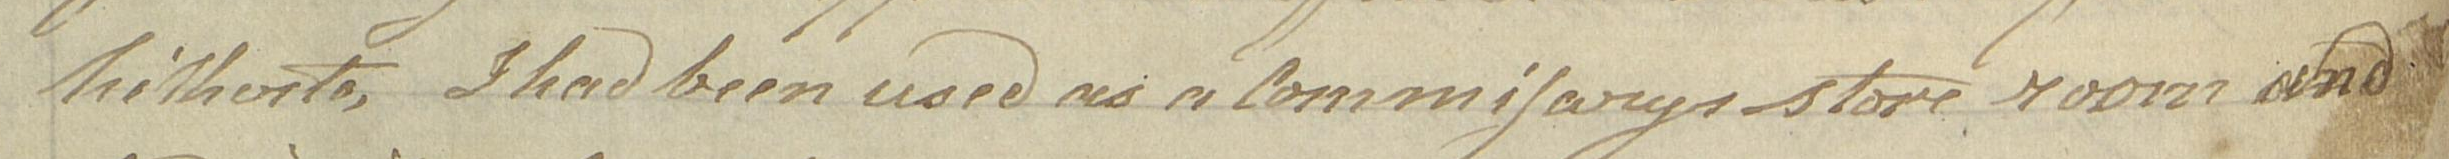hitherto I had been used as a Commisarys store room and
